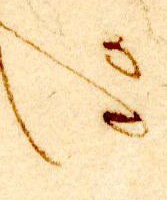To
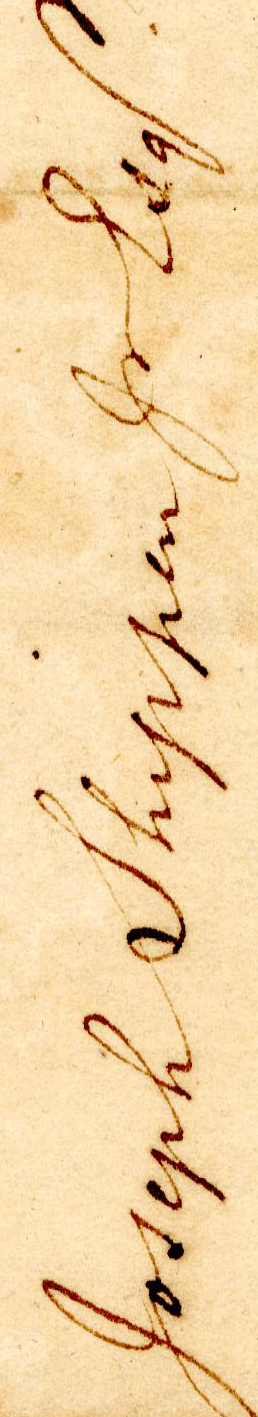Joseph Shippen Jr Esq^r.
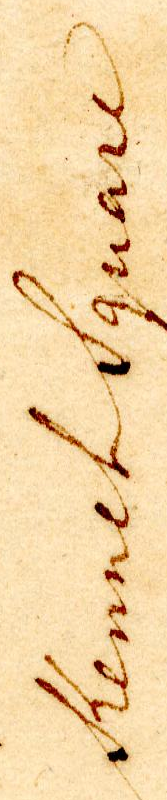Kennet Square
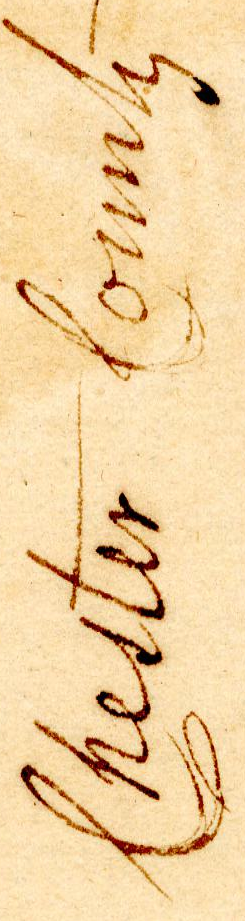Chester County
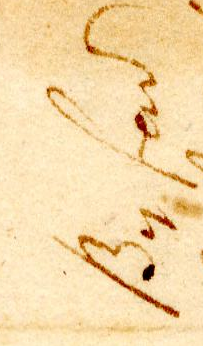By fav^r
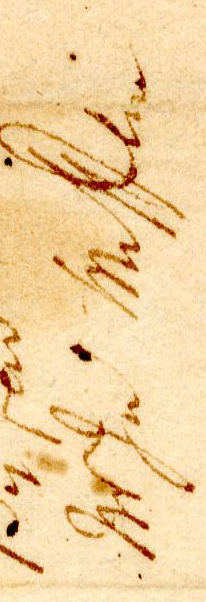M^r Jn Mifflin
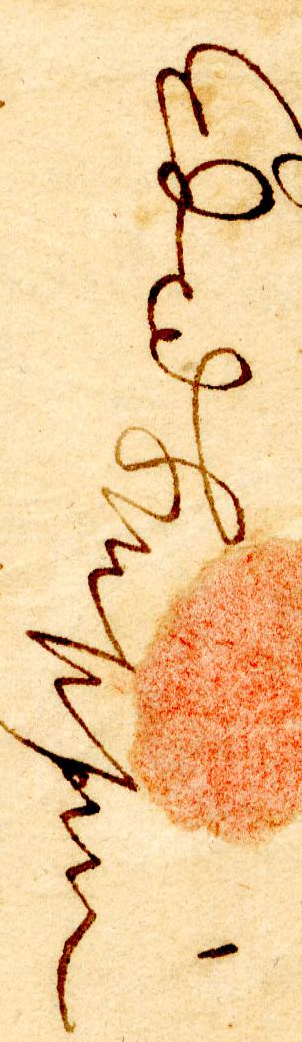Edw Shippen
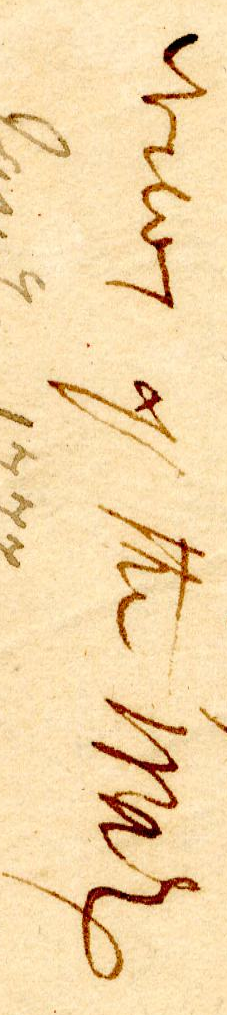news of the war
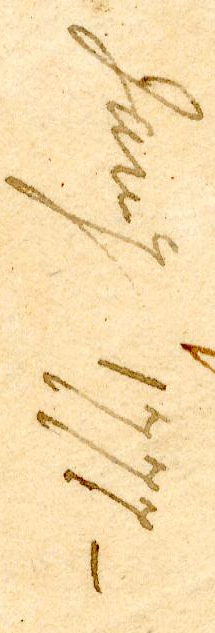Jan^y 1777-
